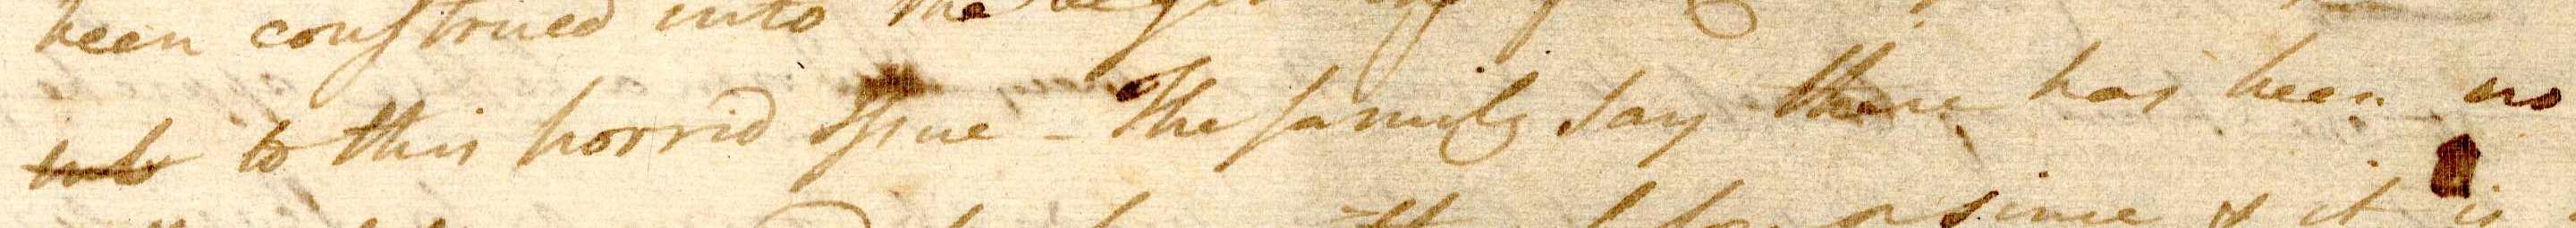not to this horrid Issue. The family say there has been no
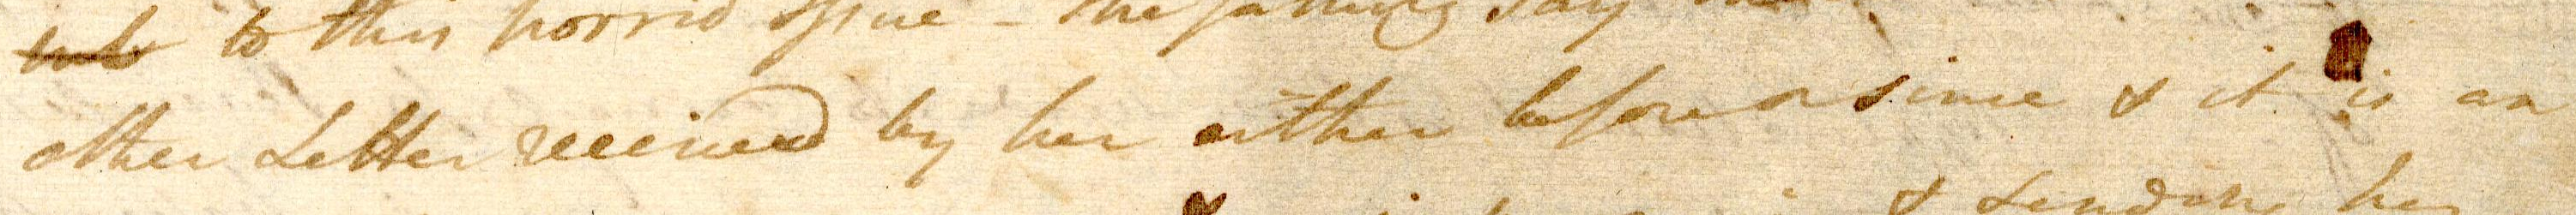other Letter received by her other before since & it is an
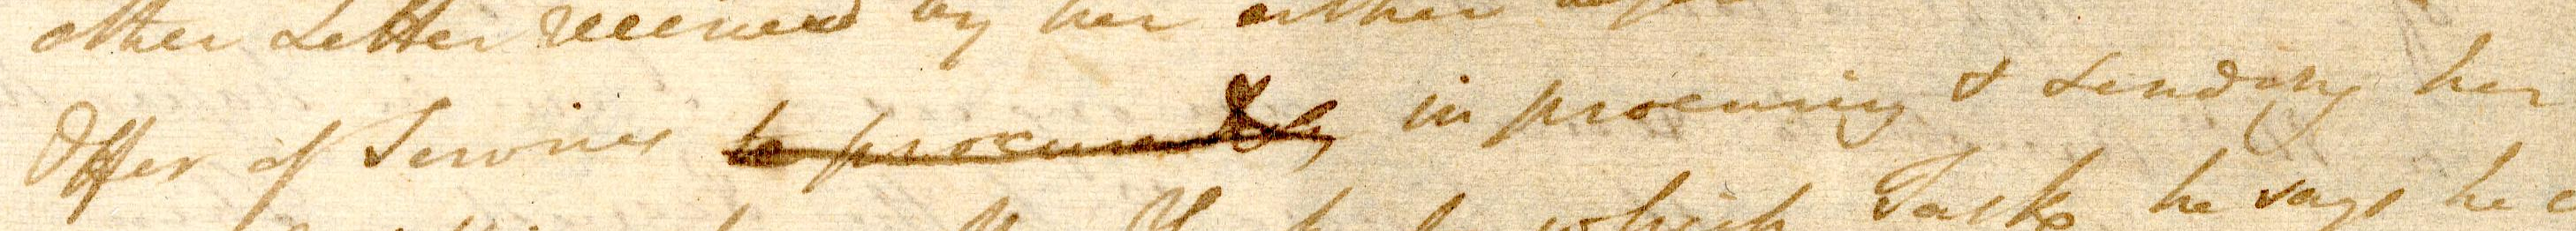Offer of Services to procure & in procuring & Lending her
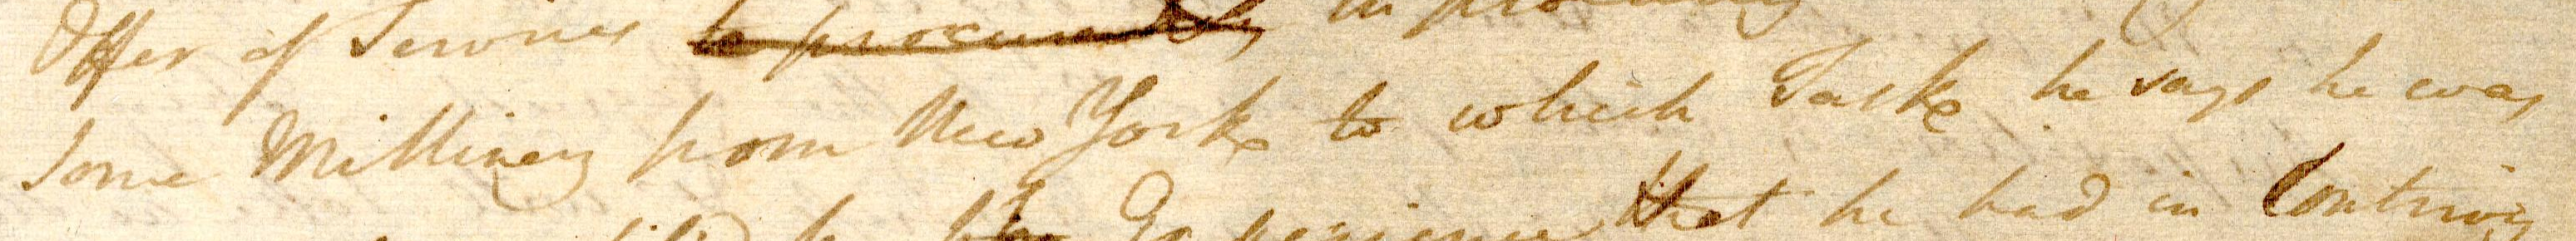Sone Milliney from New York to which Jack he says he was
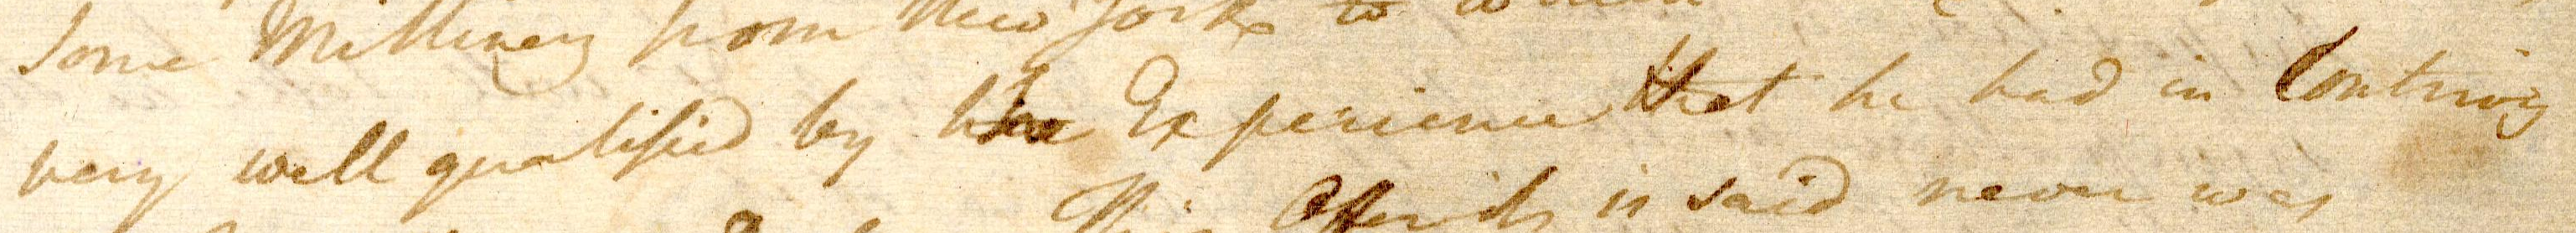very ell qualified by the Experience that he had in Contriving
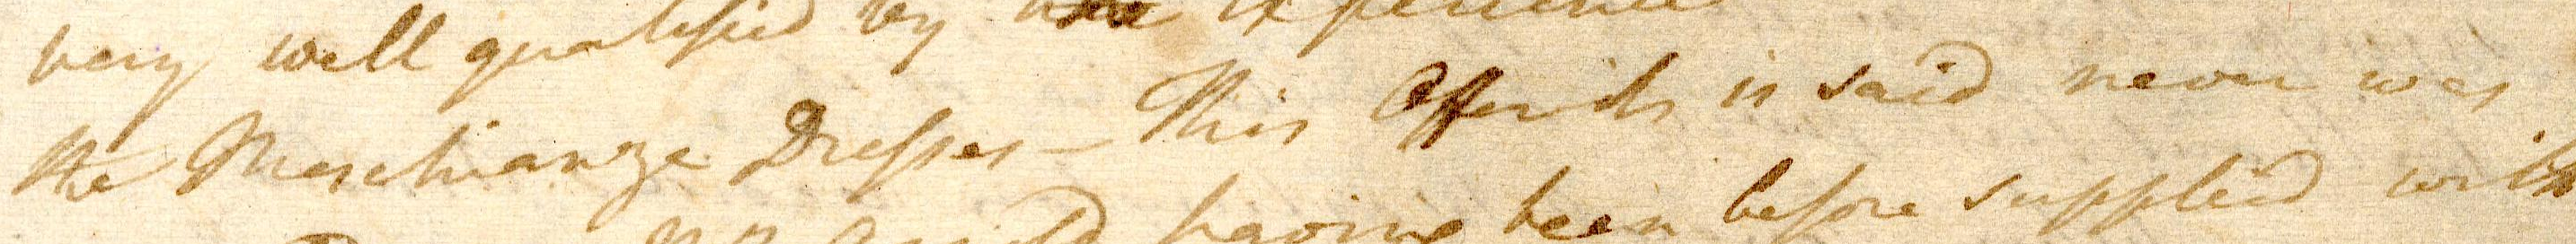the Machianze Dresses. This Offer it is said never was
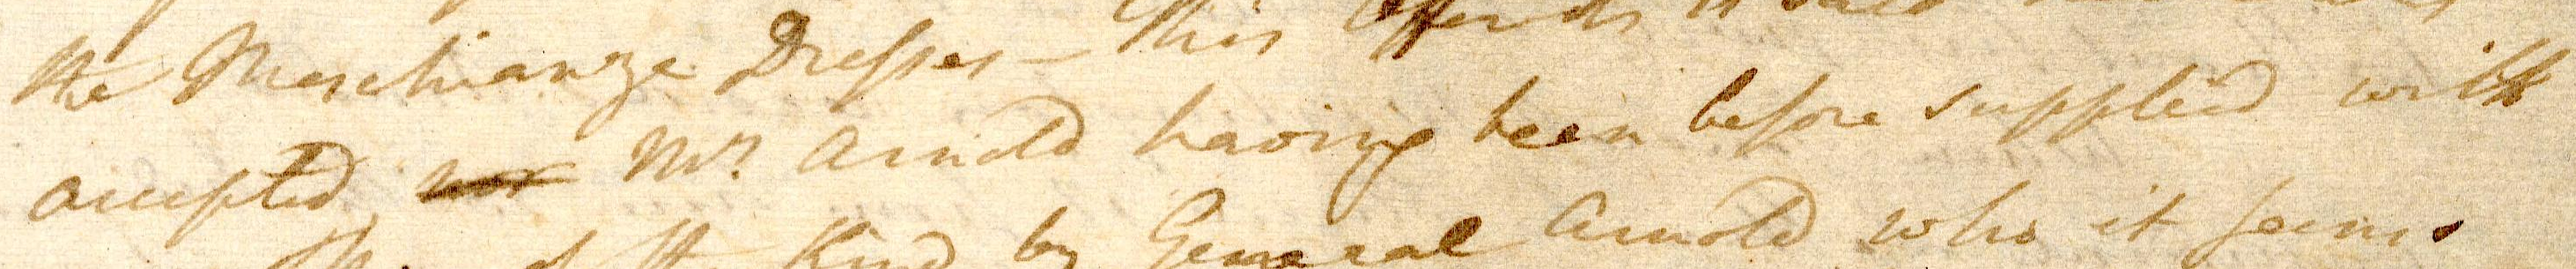accepted nor M^rs. Arnold having been before supplied with
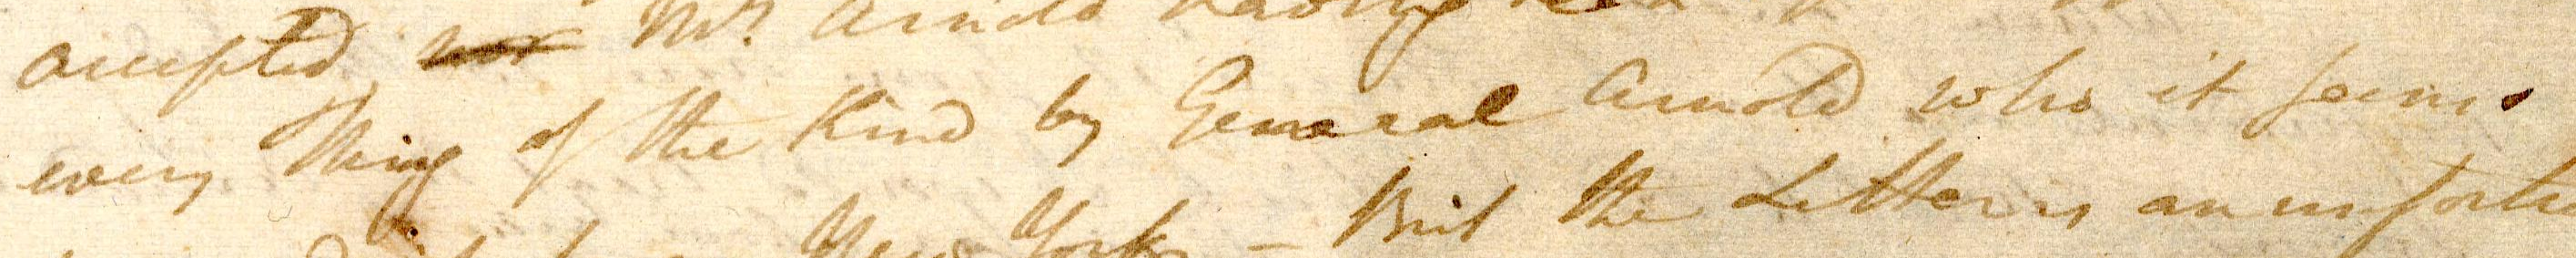every thing of the Kind by Genaral Arnold who it seems
